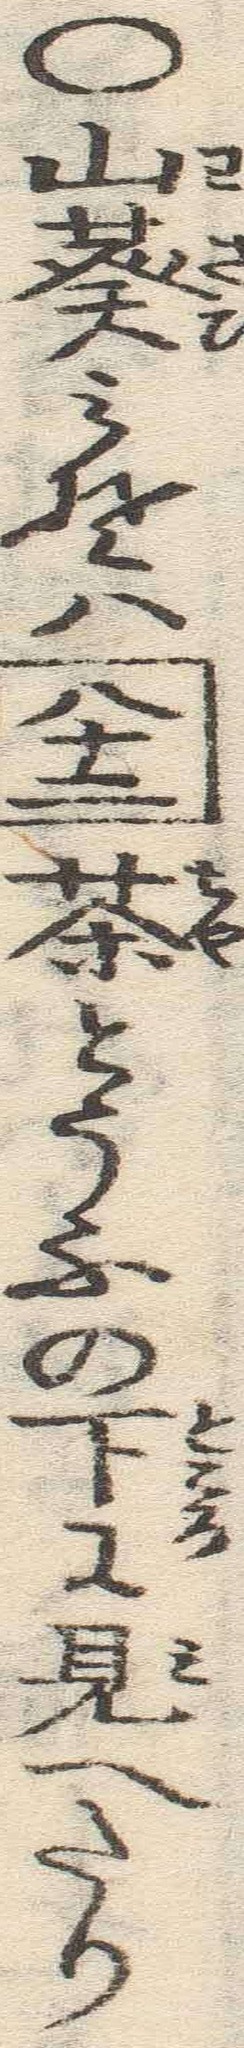○山葵みそは[八十二]茶とうふの下に見へたり

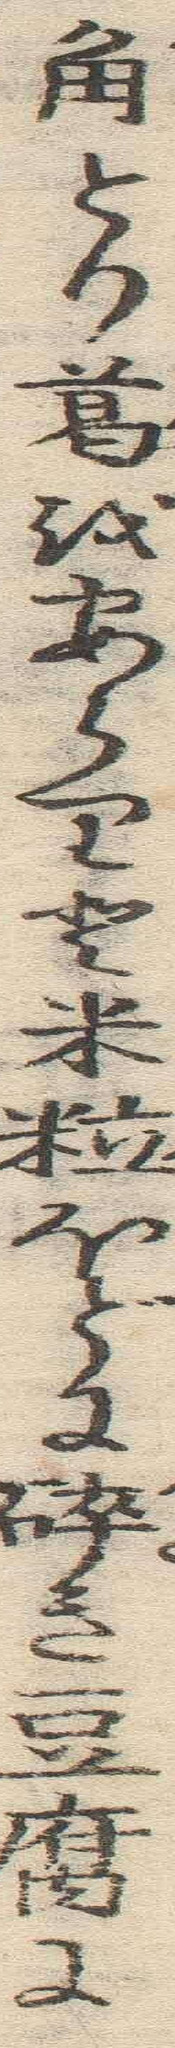角とり葛をあらりと米粒ほどに砕き豆腐に
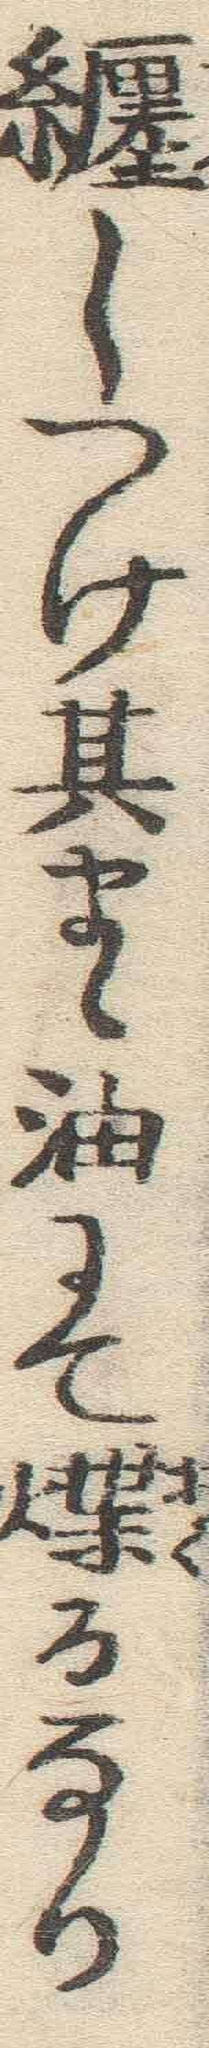纏しつけ其まゝ油にて煠るなり
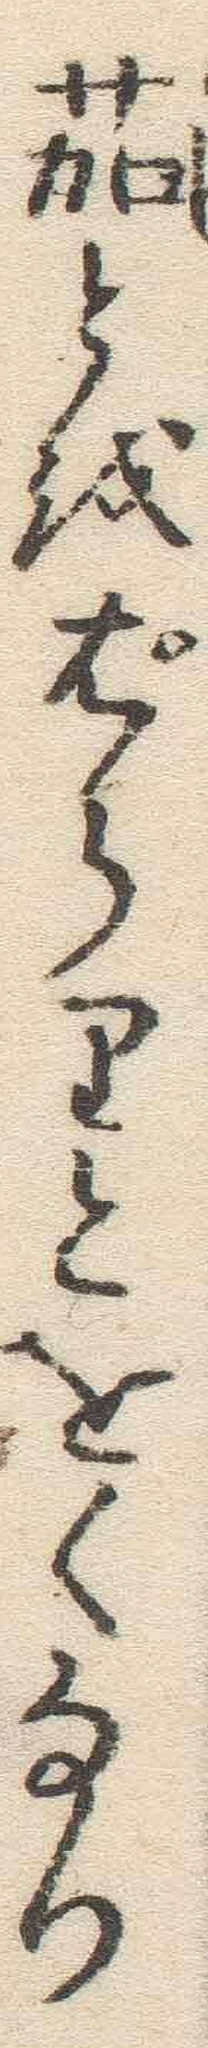茄とをぱらりとをくなり
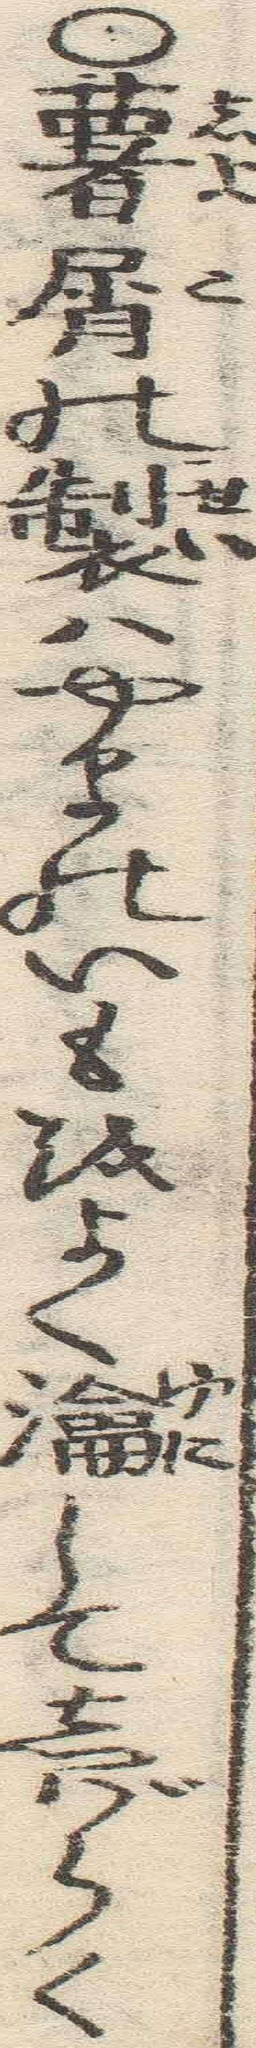○薯屑の製はやまのいもをよく瀹してしばらく
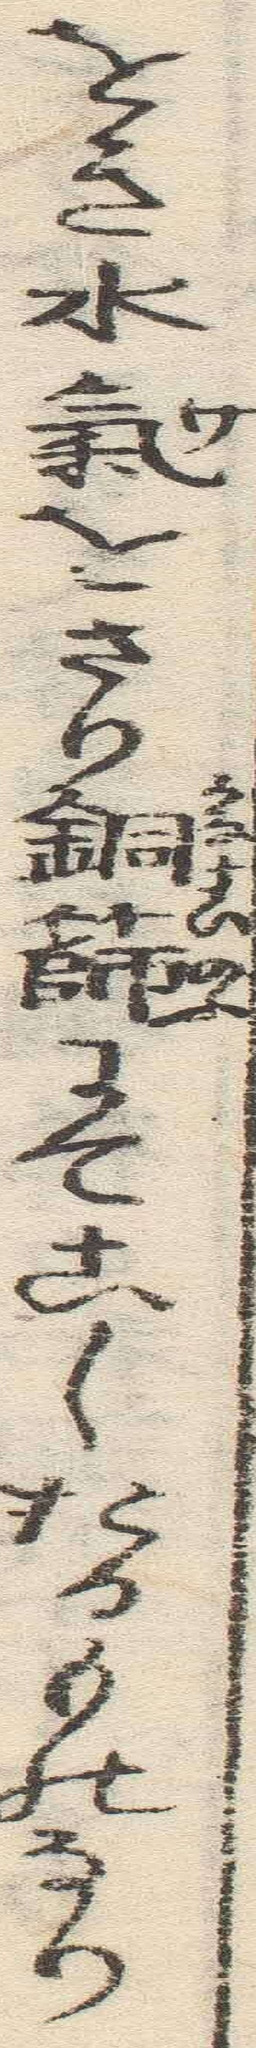をき水気をさり銅篩にてこしたるものなり
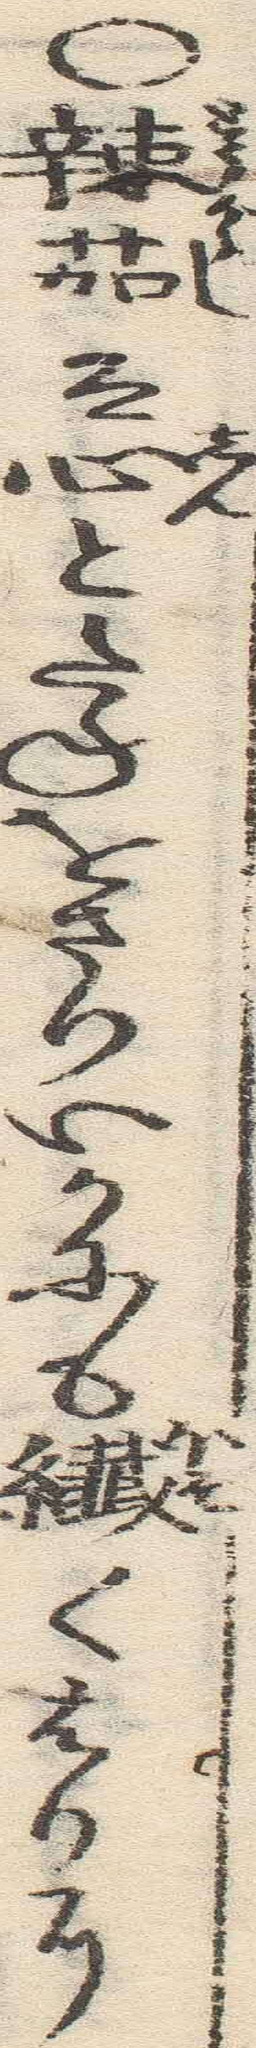○辣茄は心とたねをさりいかにも繊くはりに
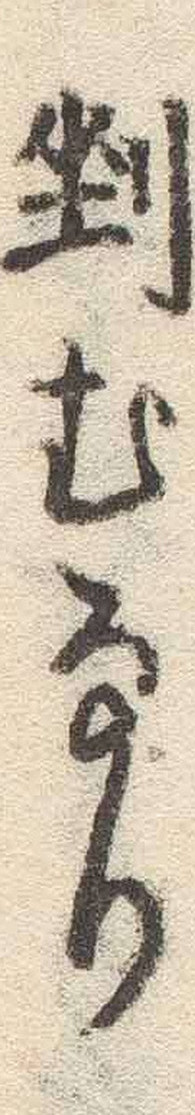剉むなり
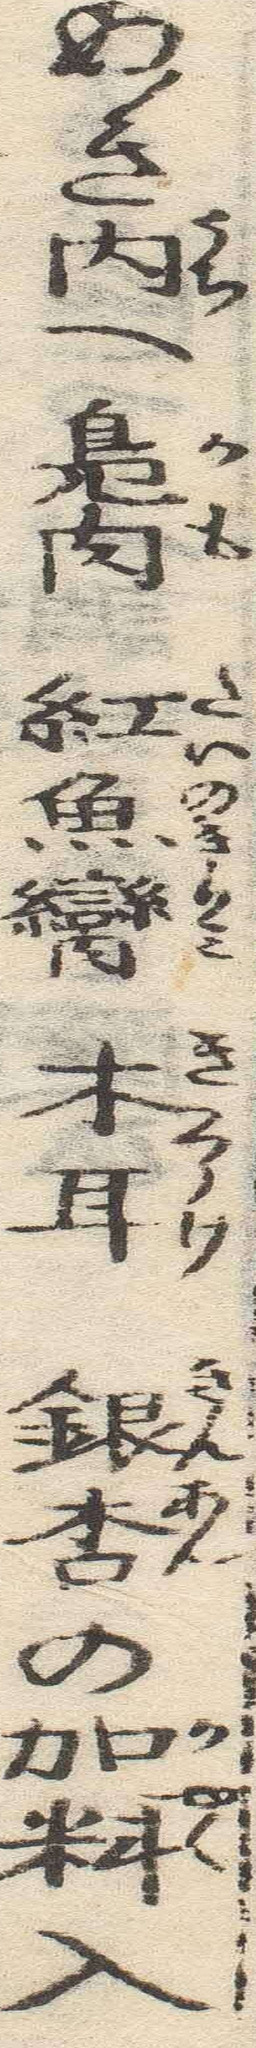ぬき内へ鳬肉紅魚臠木耳銀杏の加料入
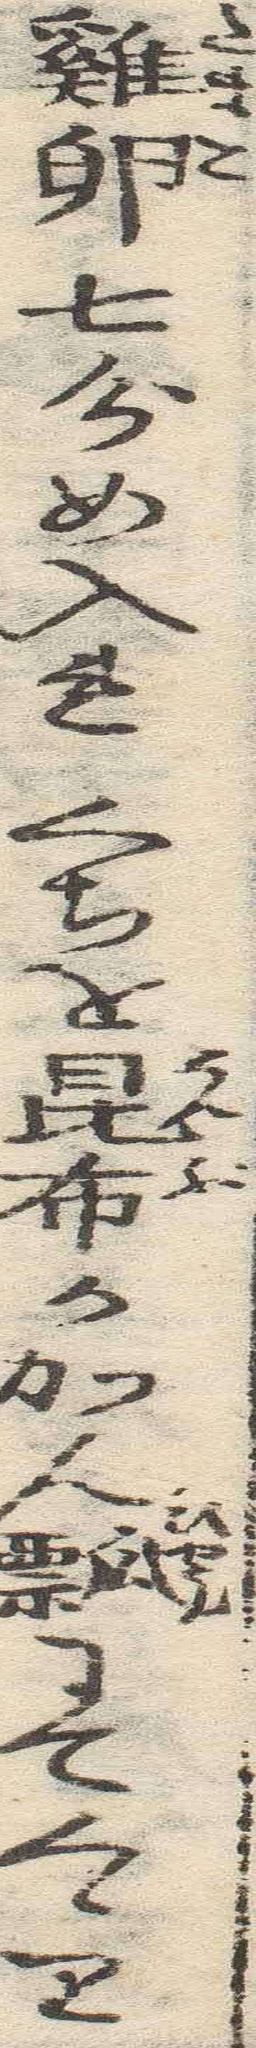雞卵七分め入れくちを昆布かかん瓢にてくゝり
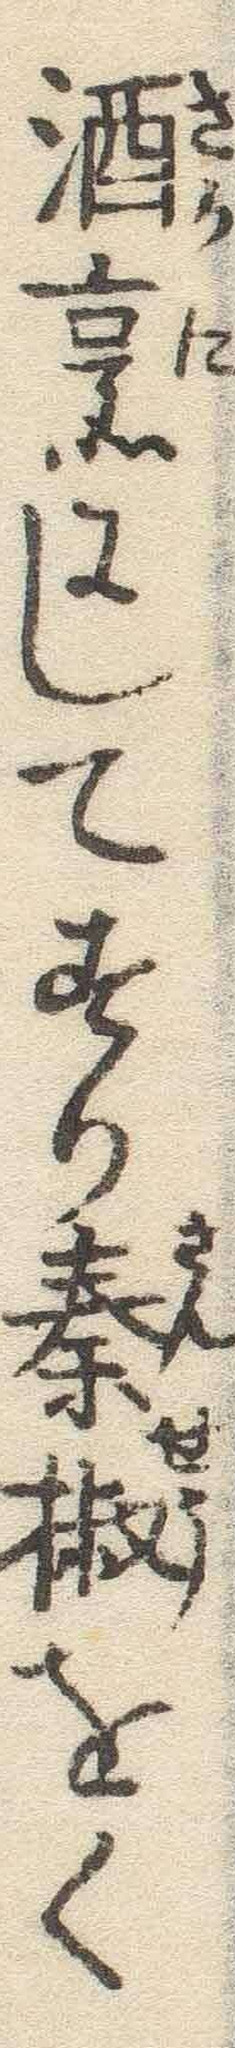酒烹にしてすり秦椒をく
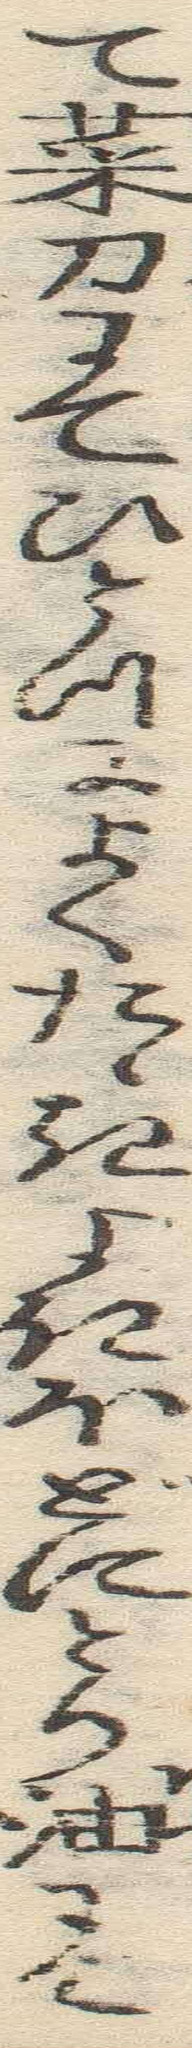て菜刀にてひとつによくたゝきよきほどにとり油にて
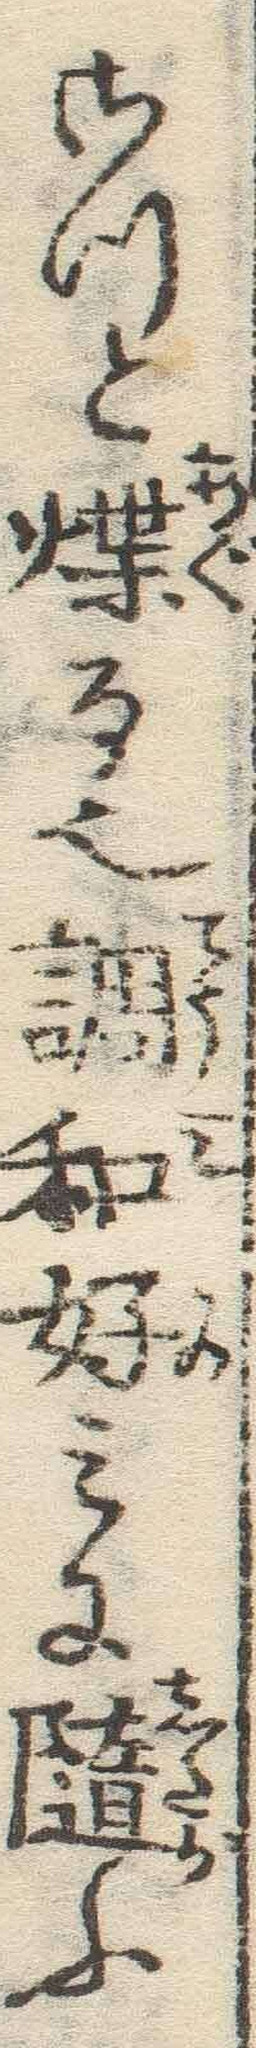さつと煠る也調和好みに随ふ

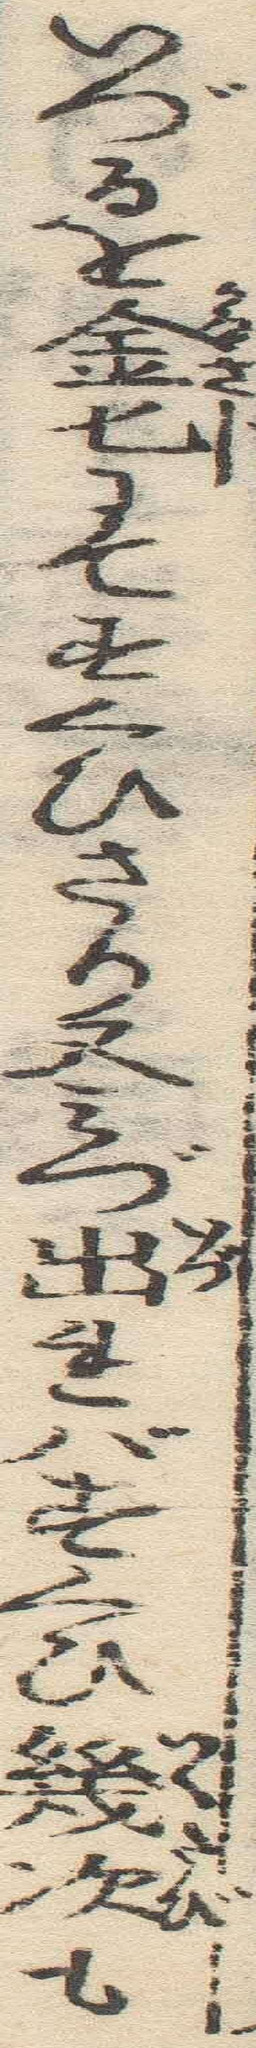いづるを金匕にてすくひさり又みづ出ればすくひ幾次も
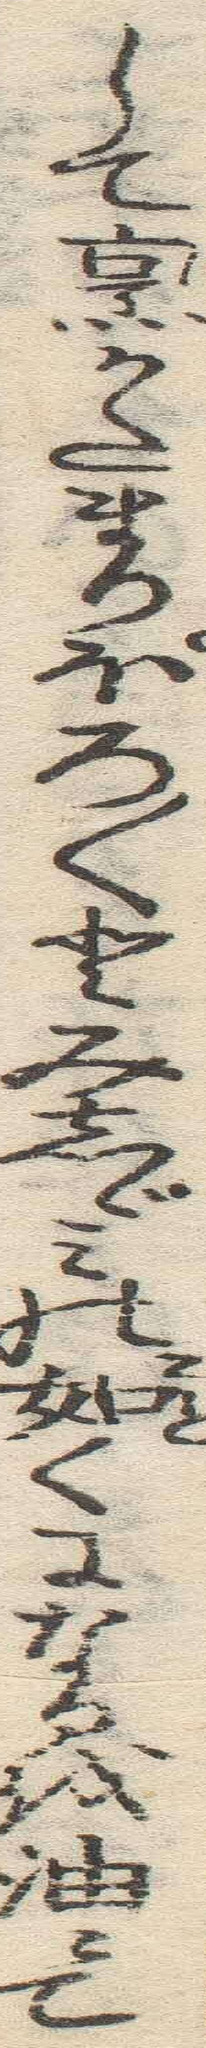して烹かたまりぽろ〳〵とみしゞみの如くになるを油にて
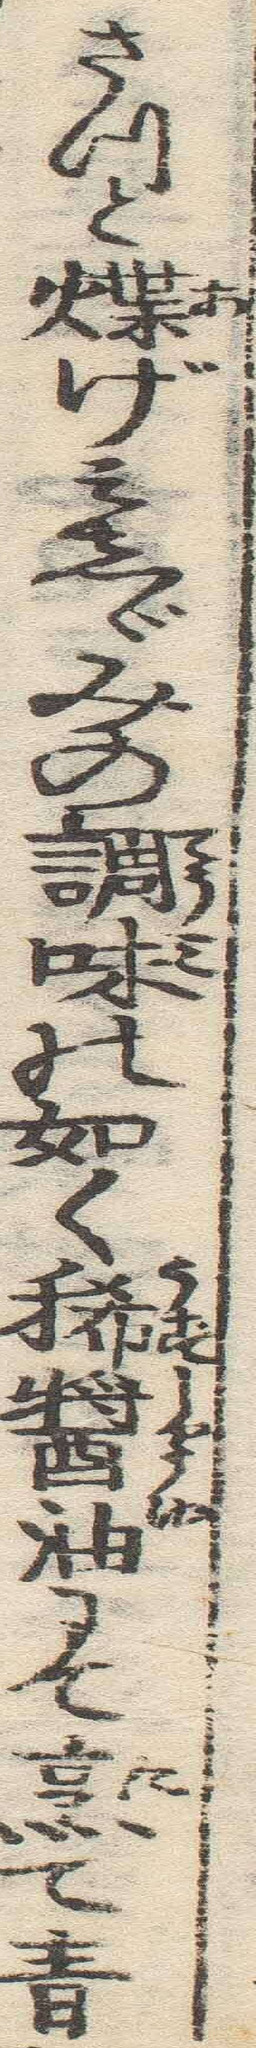さつと煠げみしゞみの調味の如く稀醤油にて烹て青
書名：豆腐百珍
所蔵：東京学芸大学附属図書館 国文学研究資料館
